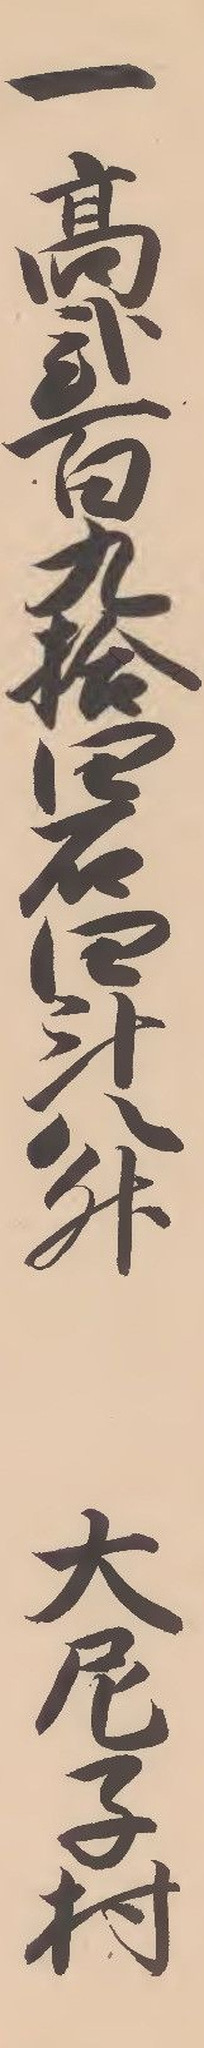一高弐百九拾四石四斗八升大尼子村
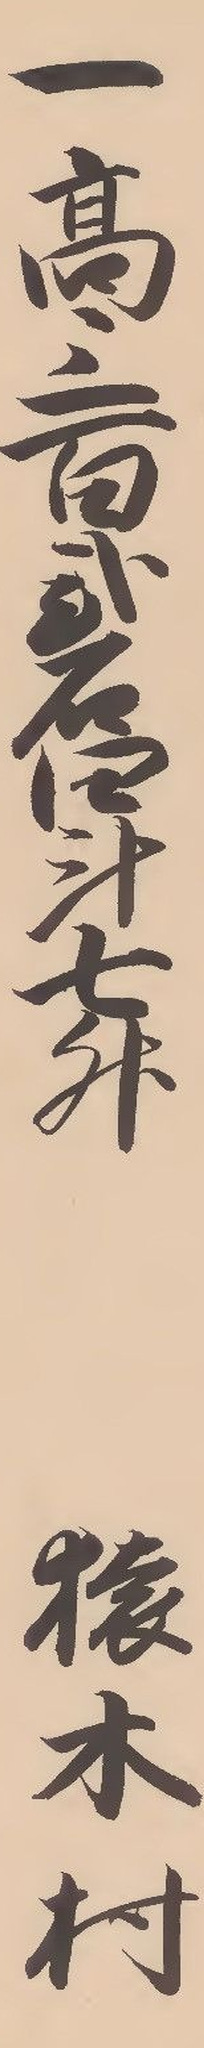一高三百弐石四斗七升猿木村
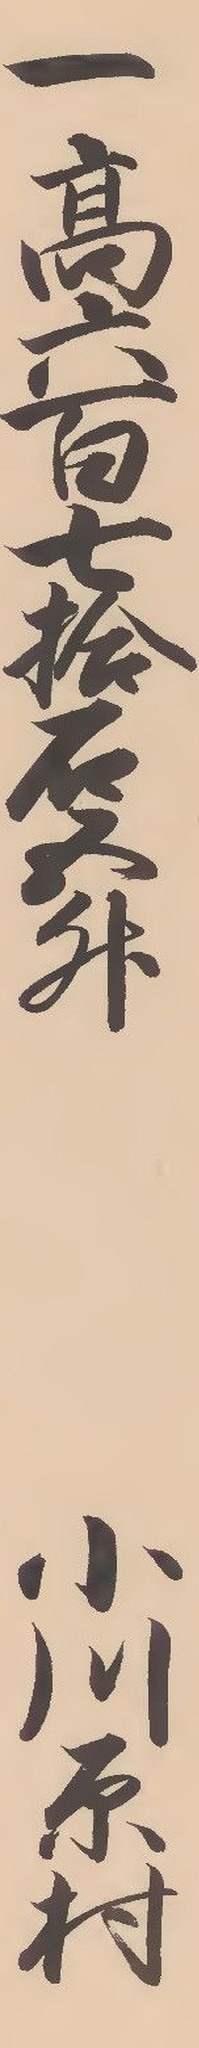一高六百七拾石五升小川原村
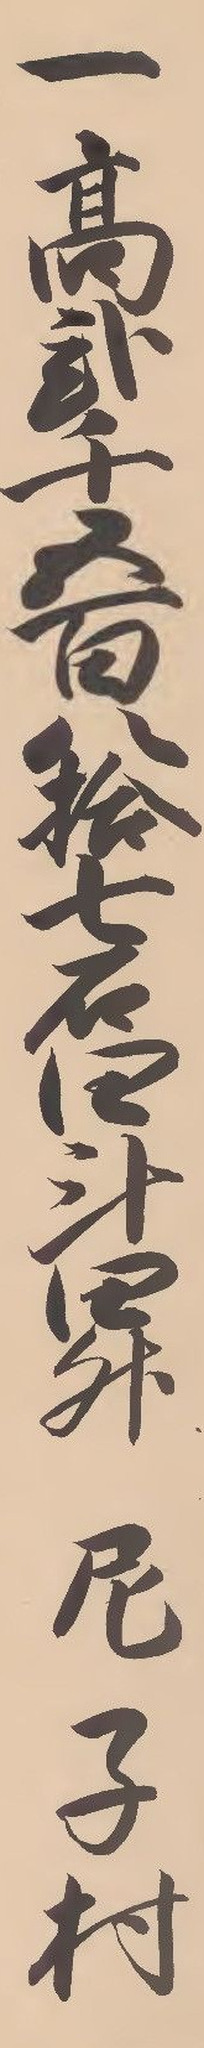一高弐千五百八拾七石四斗四升尼子村
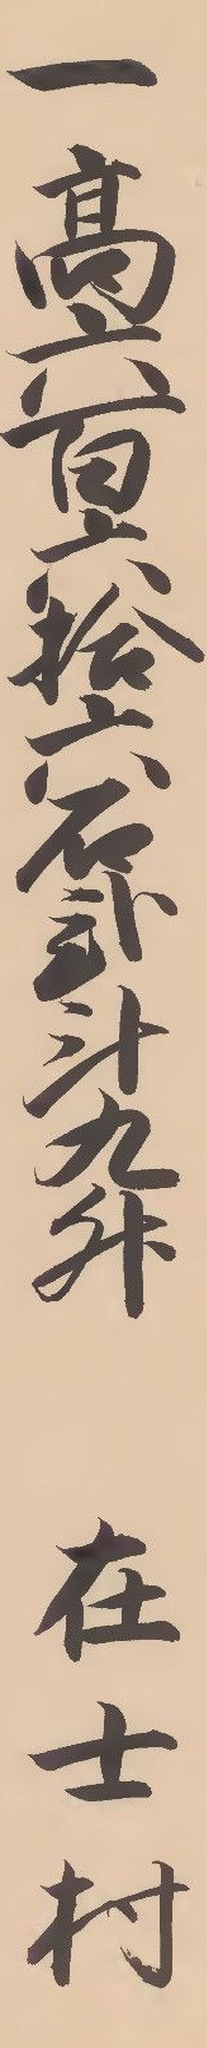一高六百六拾六石弐斗九升在士村
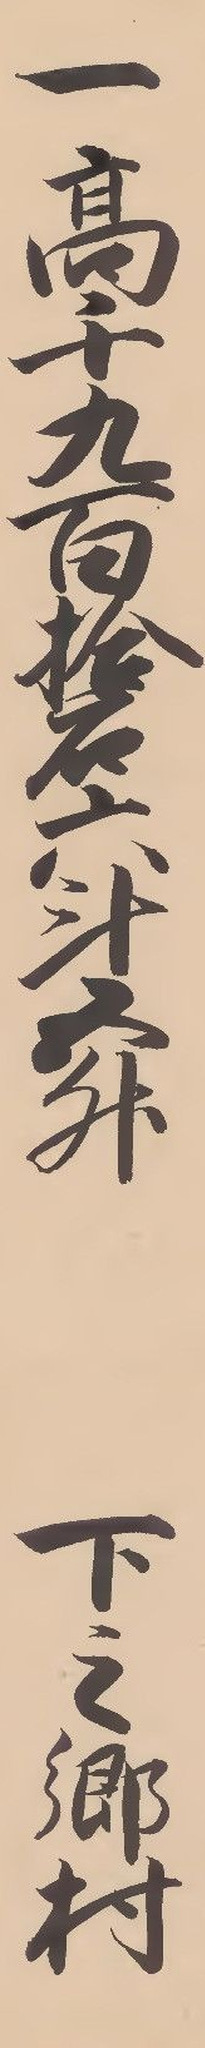一高千九百拾石六斗五升下之郷村
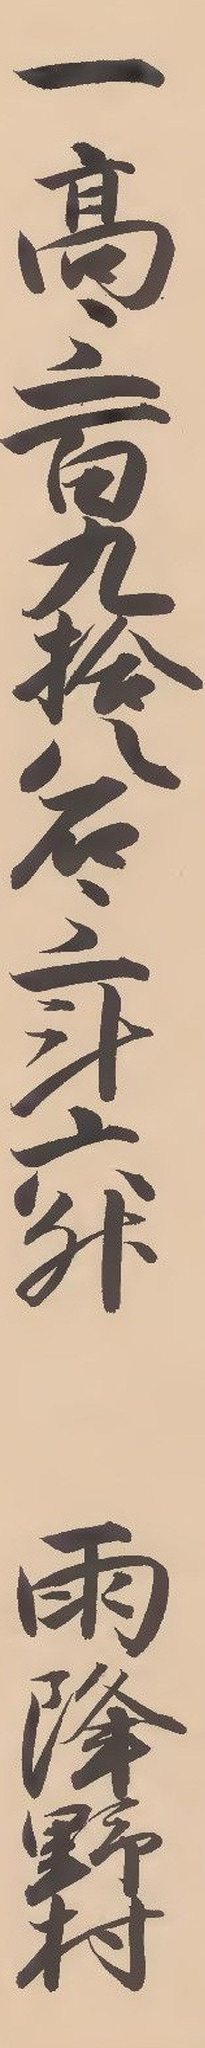一高三百九拾八石三斗六升雨降野村

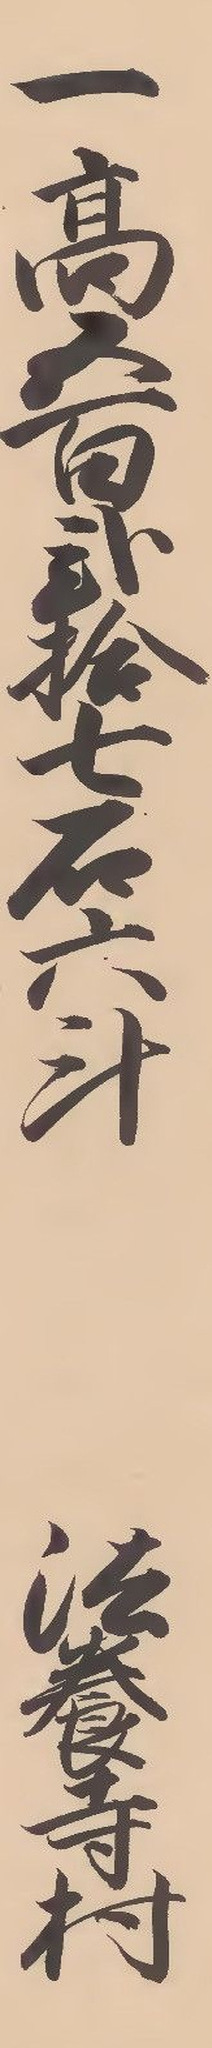一高五百弐拾七石六斗法養寺村
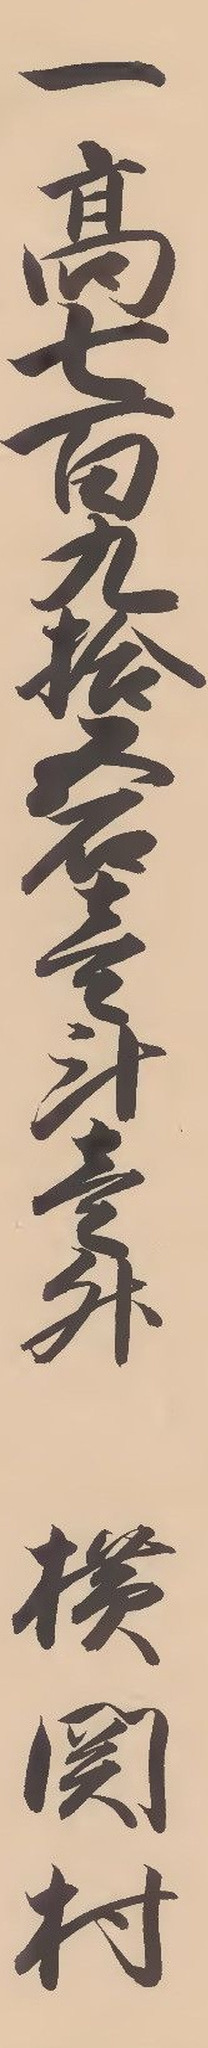一高七百九拾五石壱斗壱升横関村
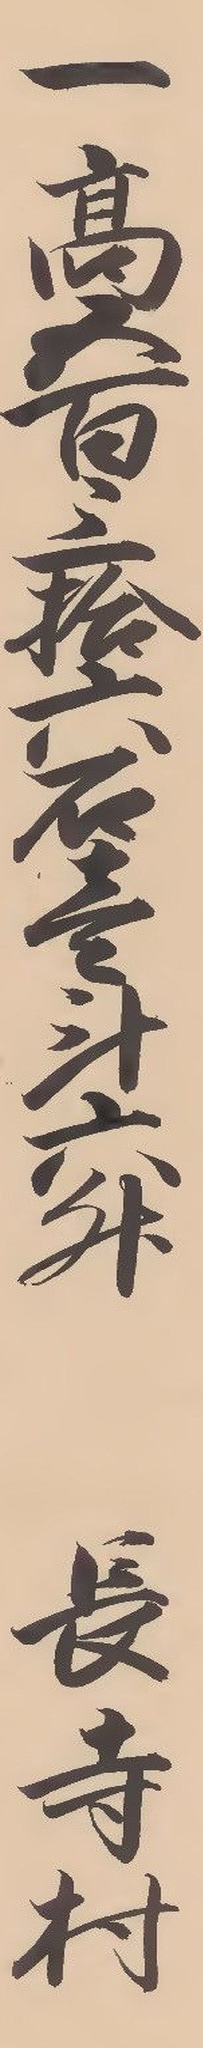一高五百三拾六石壱斗六升長寺村
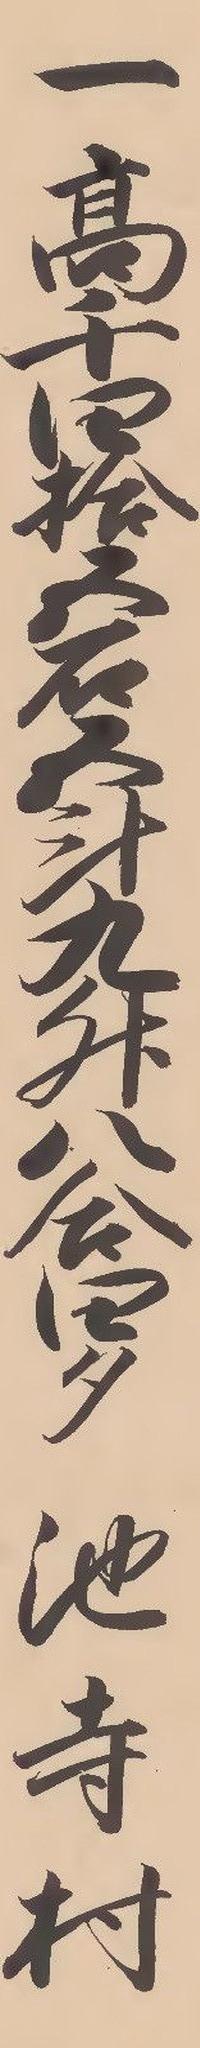一高千四拾五石五斗九升八合四勺池寺村
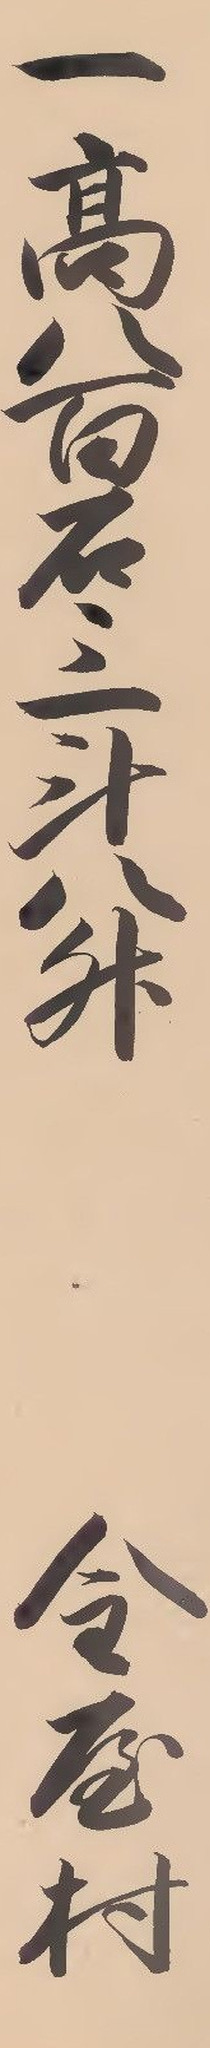一高八百石三斗八升金屋村
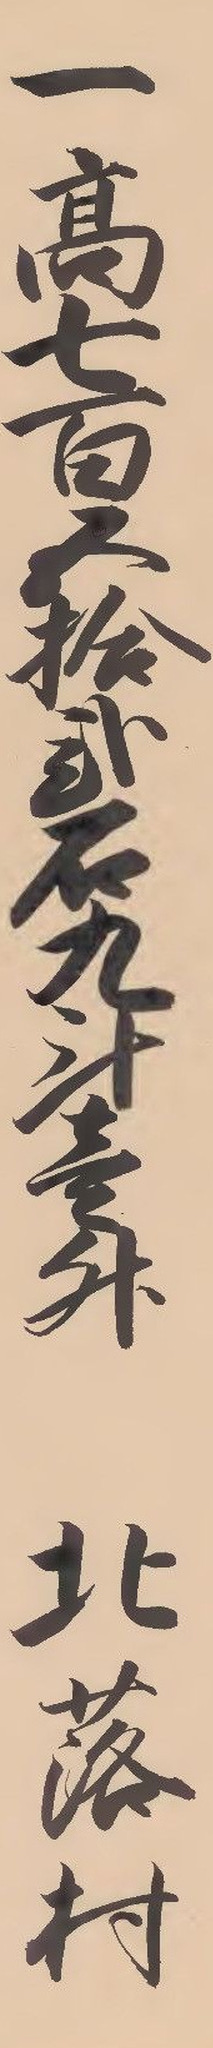一高七百五拾弐石九斗壱升北落村
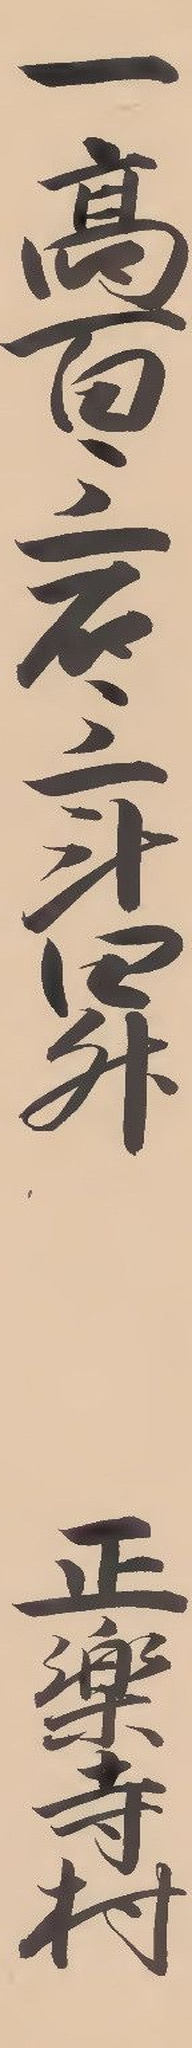一高百三石三斗四升正楽寺村
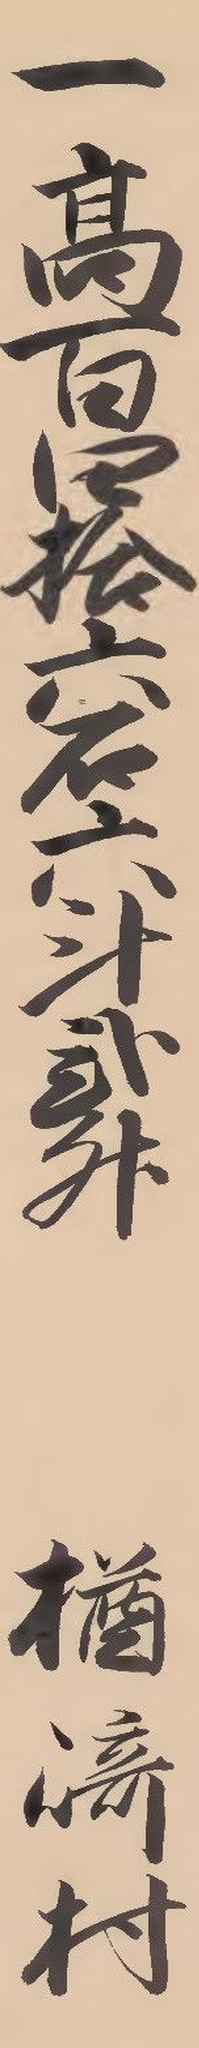一高百四拾六石六斗弐升猶崎村

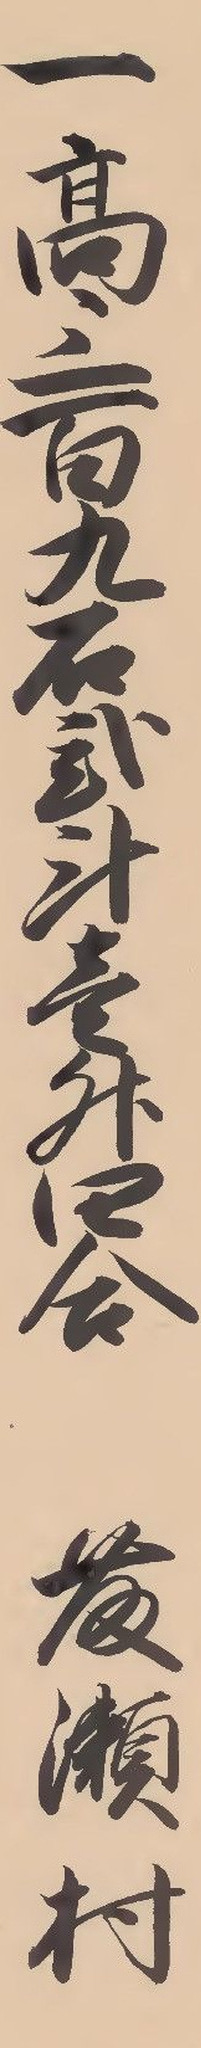一高三百九石弐斗壱升四合藤瀬村
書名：近江国郷帳
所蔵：国立公文書館 National Archives of Japan
